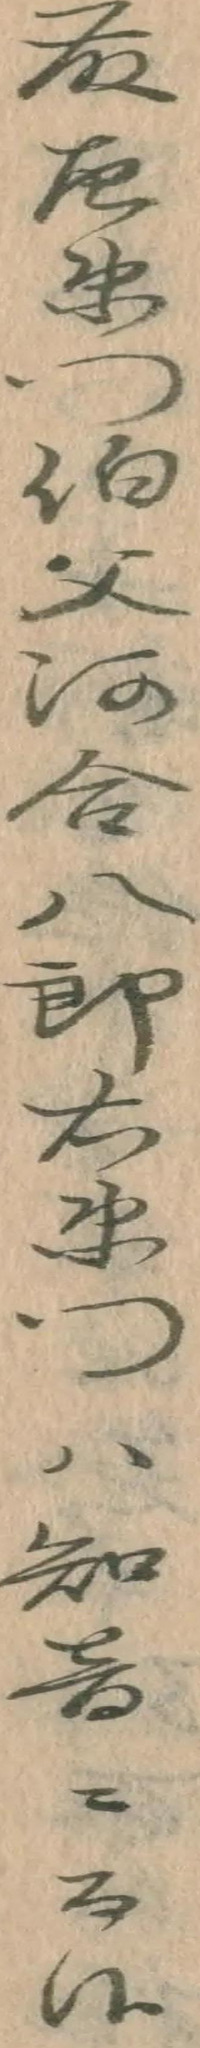藤左衛門伯父河合八郎右衛門は知音に而候
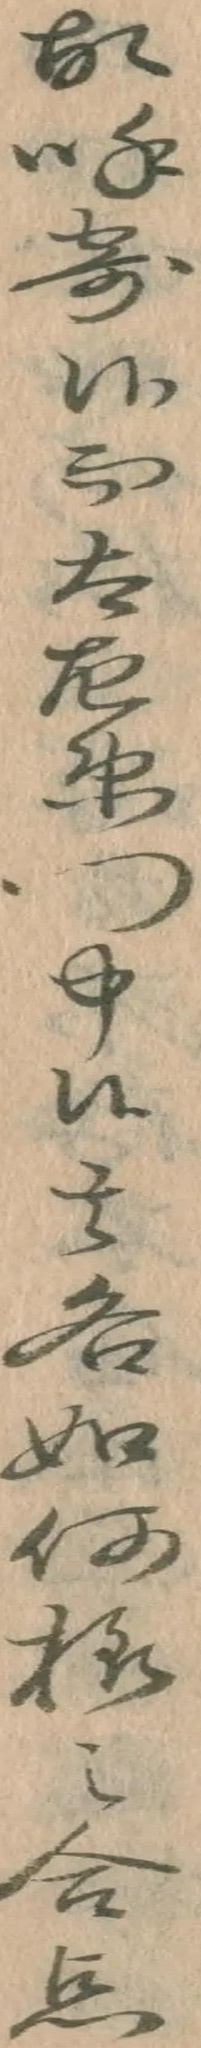故呼寄候而太左衛門申候者各如何様之合点
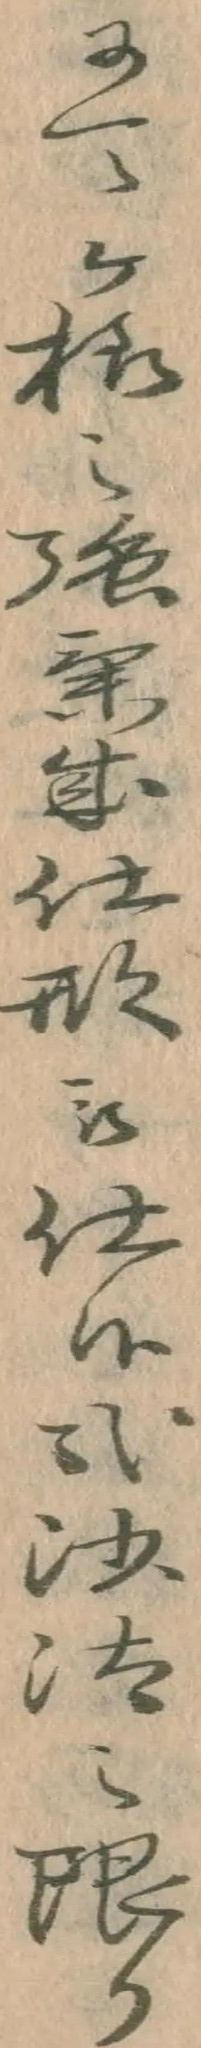尓てけ様之強気成仕形被仕候哉沙汰之限り
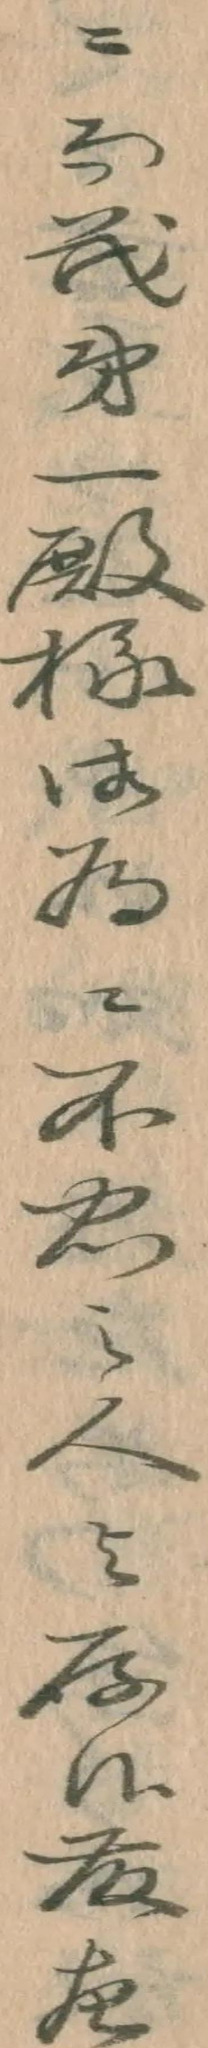に而茂弟一殿様御為に不忠之人与存候藤左
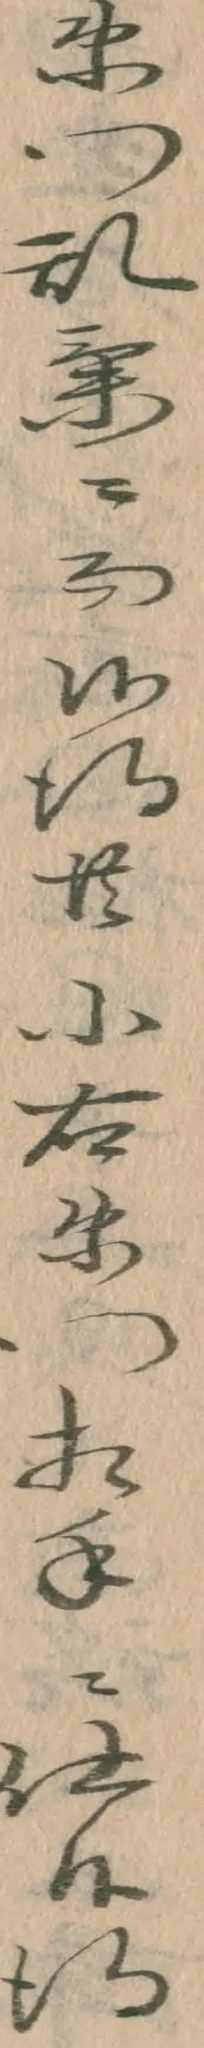衛門乱気に而候得共小右衛門相手に仕候得
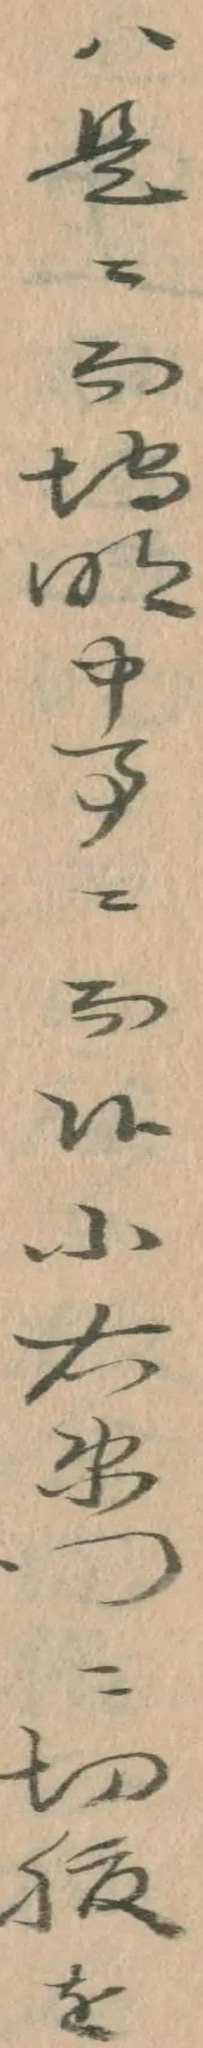は是に而埒明申事に而候小右衛門に切腹を
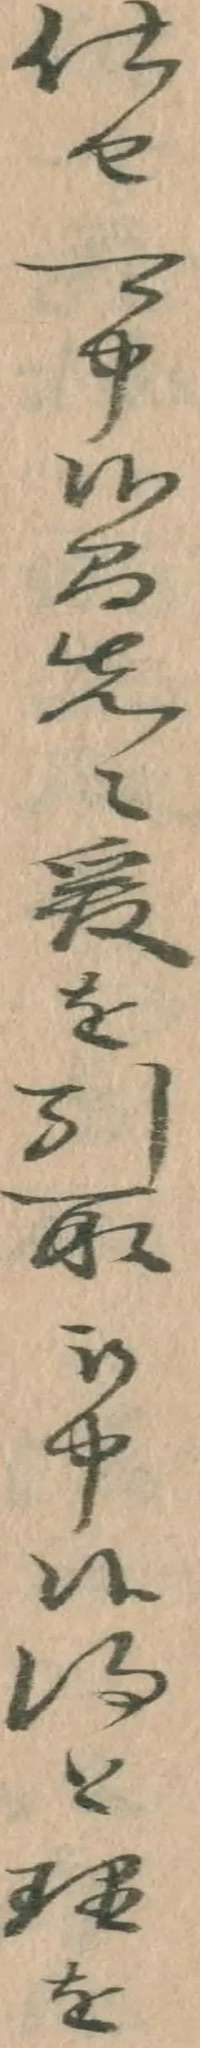仕せ可申候間先々爰を引取被申候得と理を
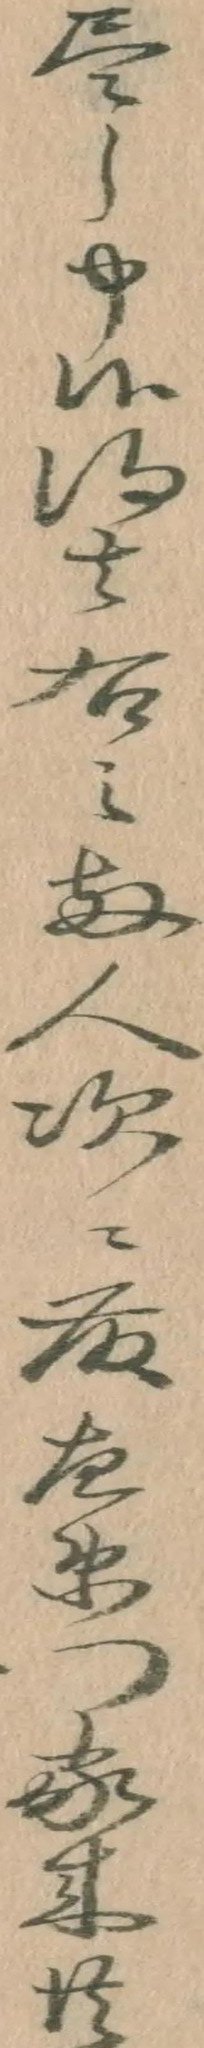尽し申候得者右之両人次に藤左衛門家来共
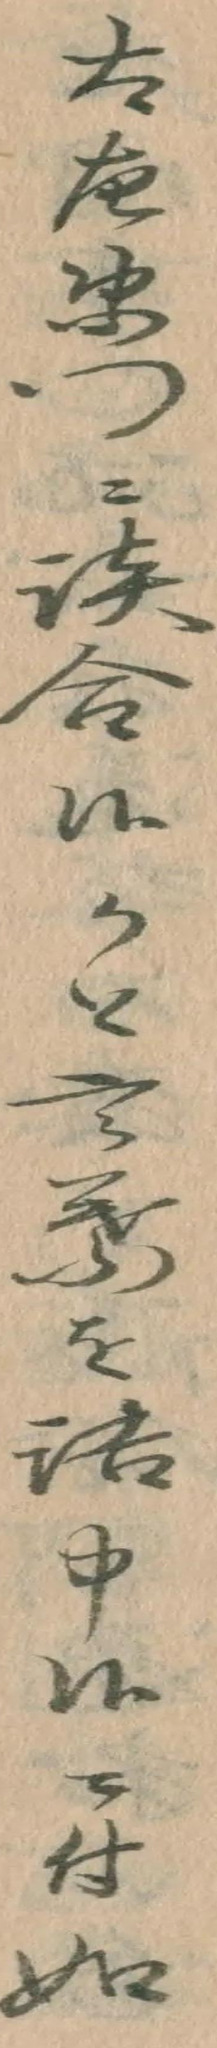太左衛門に談合候かと言葉を詰申候に付如
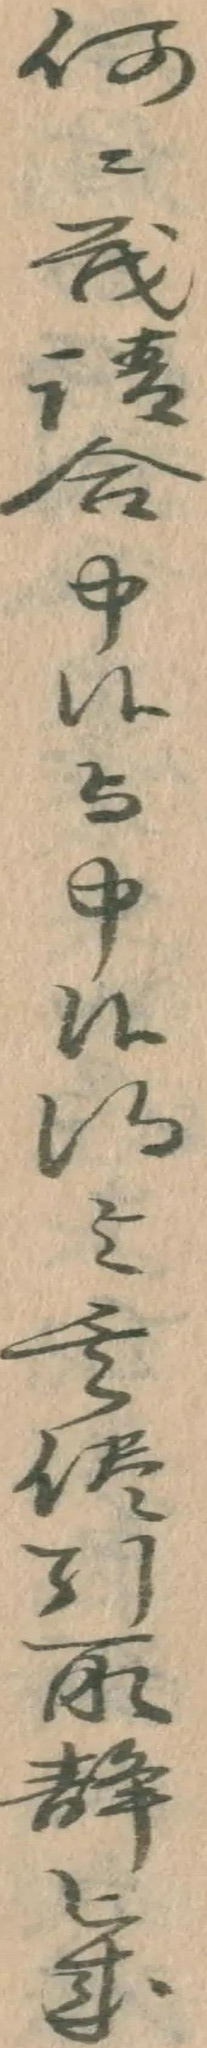何に茂請合申候与申候得与其侭引取静被成
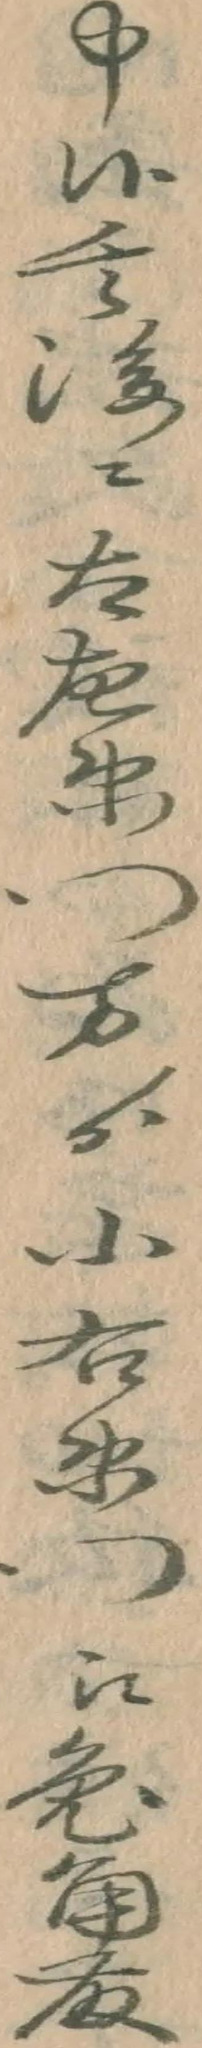申候其後に太左衛門方ゟ小右衛門江兎角藤
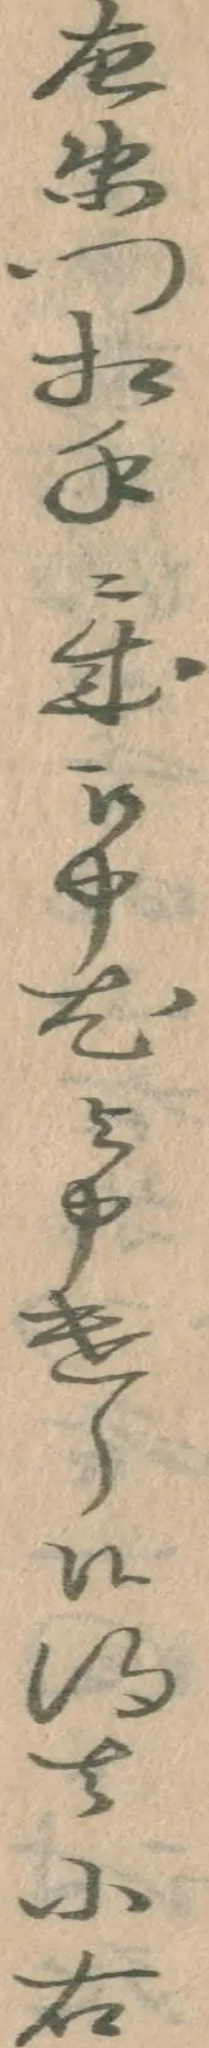左衛門相手に成被申尤与申遣し候得者小右
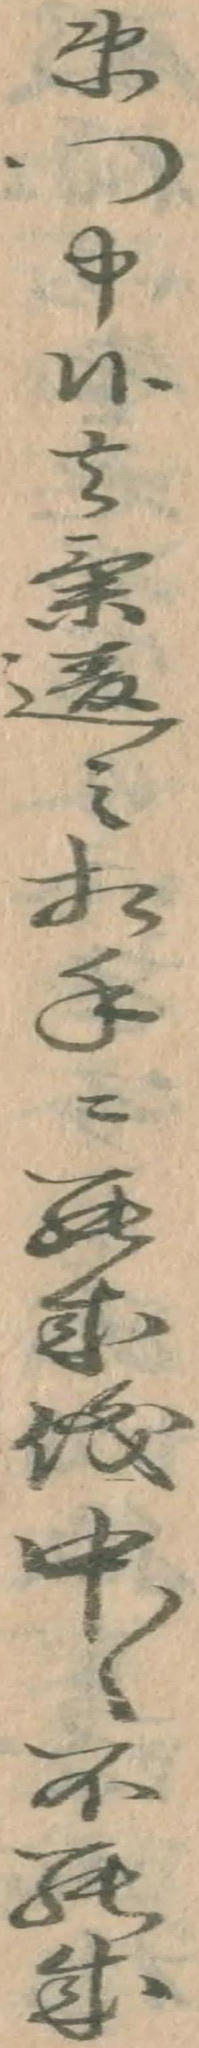衛門申候者気違之相手に罷成儀中々不罷成
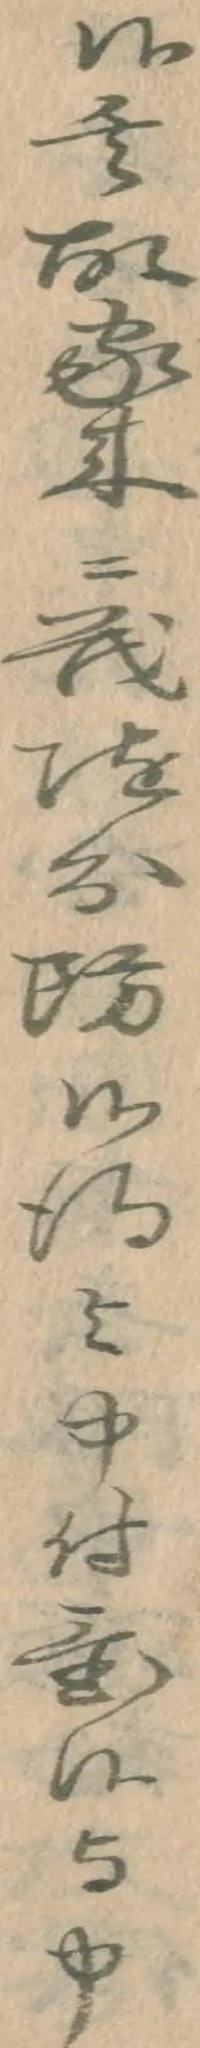候其故家来に茂随分防候得与申付置候与申

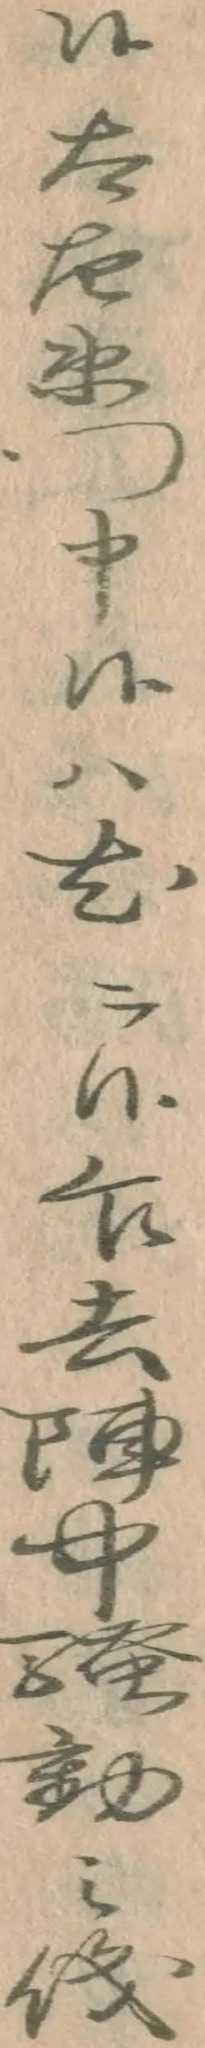候太左衛門申候は尤に候乍去陣中騒動之儀
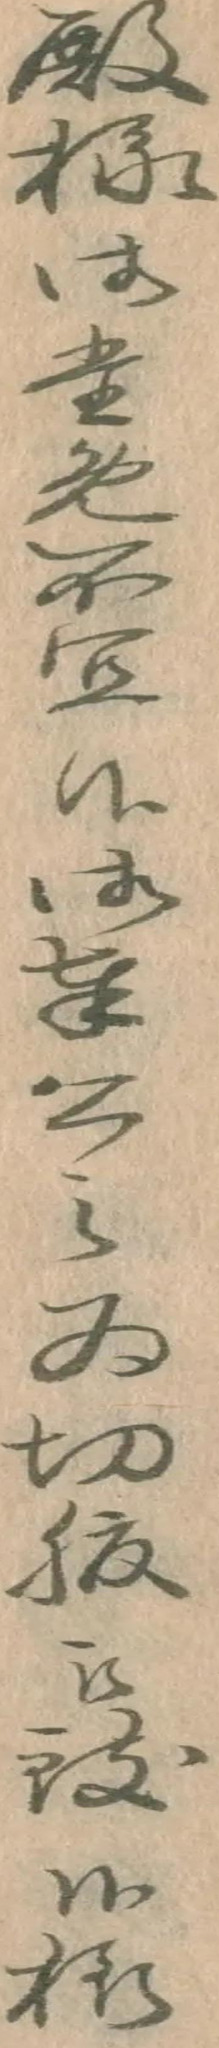殿様御当免不冝候御奉公之ゐ切腹被致候様
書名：切支丹御退治記 49巻. [4]
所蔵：国立国会図書館 National Diet Library, JAPAN
